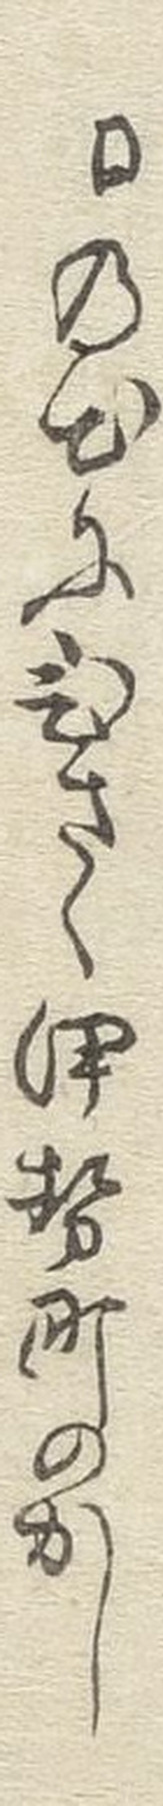日の出にひさく伊勢町のかし
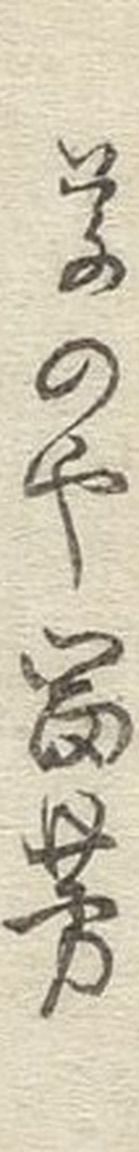草のや富芳
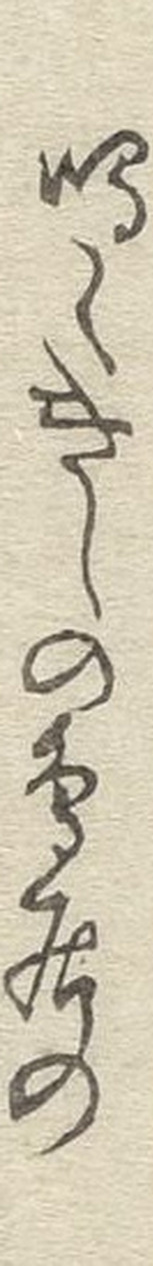鳴くきしの鳥居の
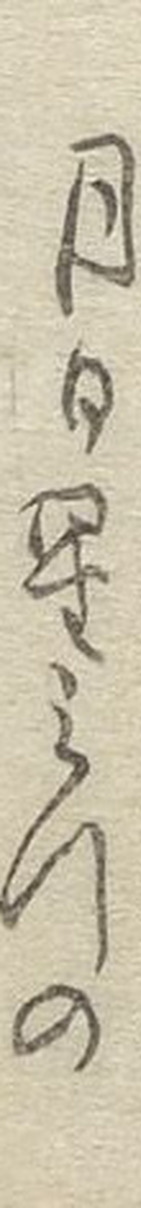月日星みつの
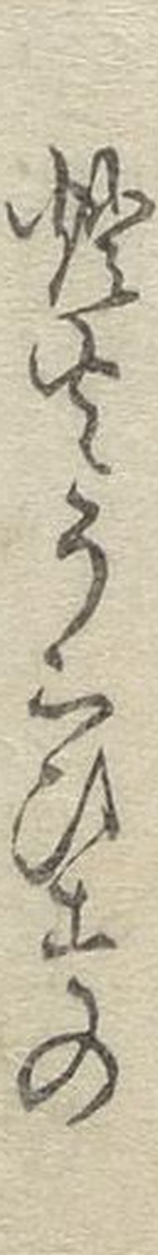燈火うくひすの
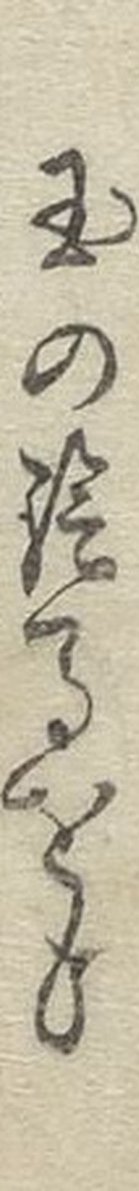玉の絵馬をも
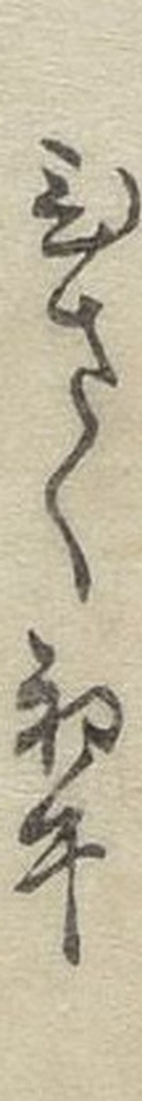ひさく初午
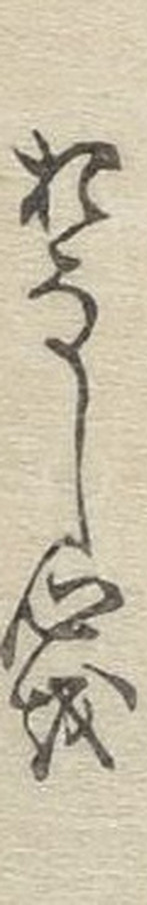おなし心を
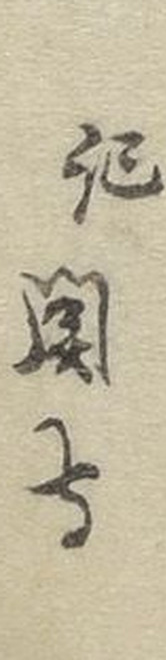紀関守
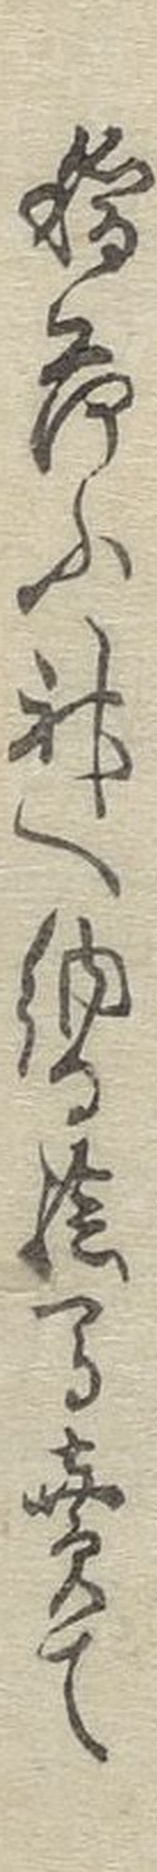稲荷ふ神へ納る絵馬売て

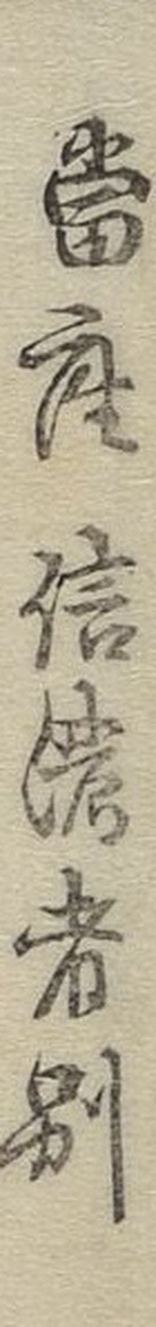当座信濃者別
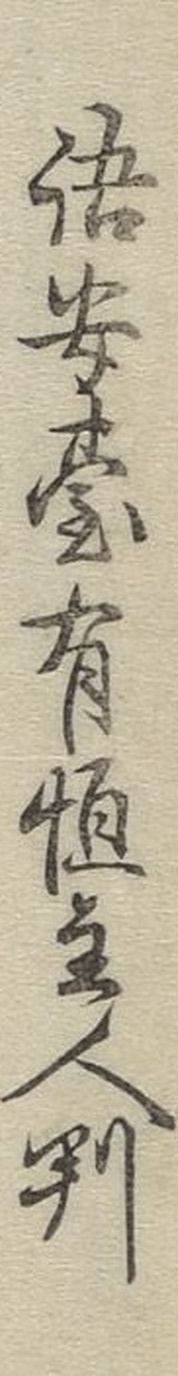語安台有恒主人判
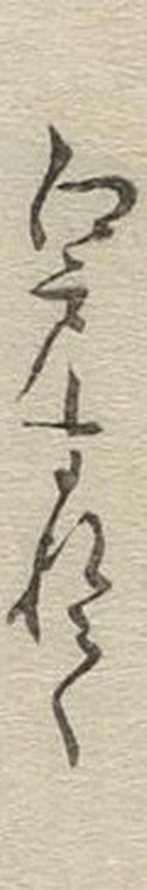えどすれて
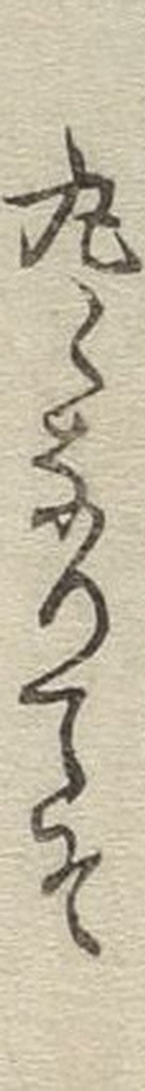丸くなりてそ
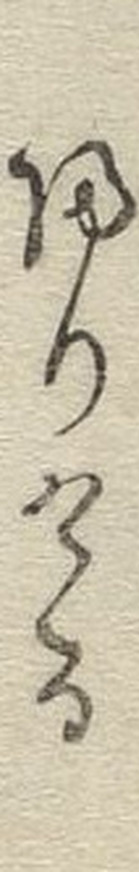帰りける
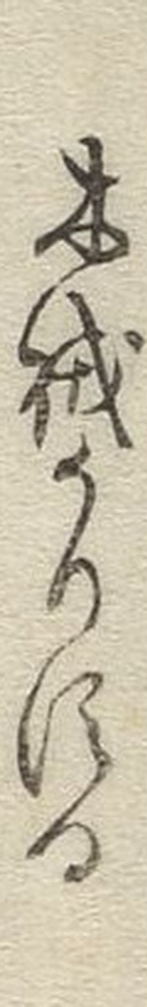木賊かりする
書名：Picture Album of People with Kyōka (Light Verse) (Kyōka shiki jinbutsu 狂歌四季人物)
